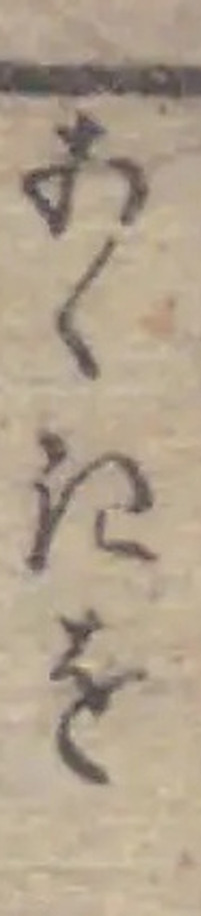あくきを
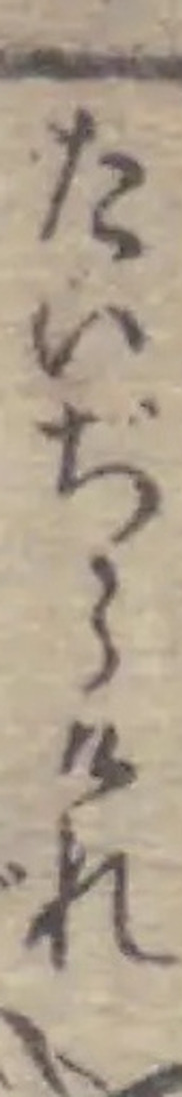たいぢしけれ
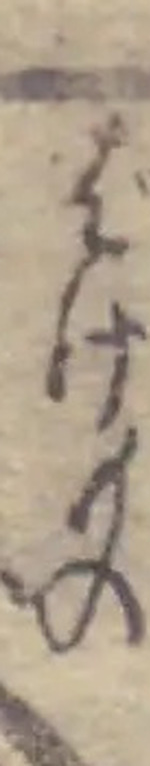ばけもの
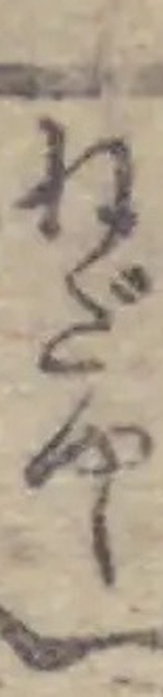ねだやし
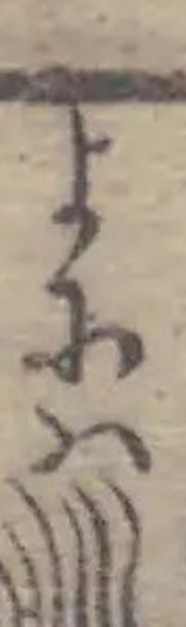よには
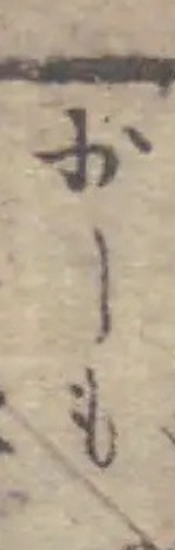少しも
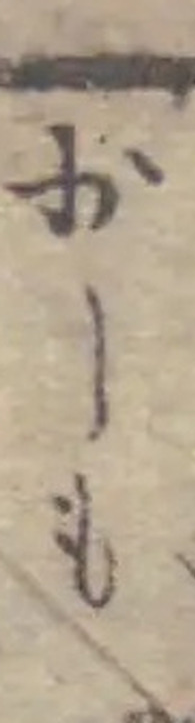少しも
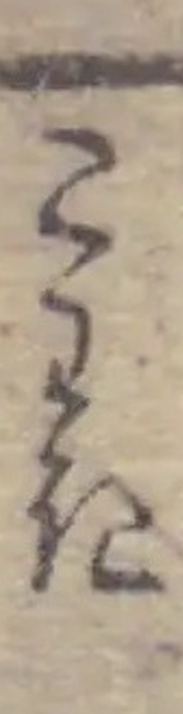こわき
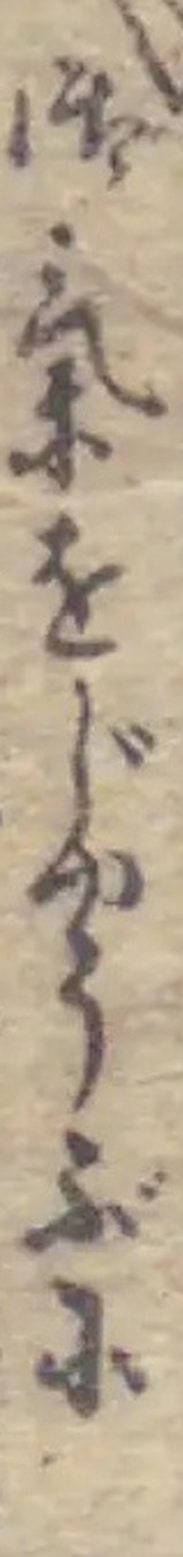御気をじやうぶに
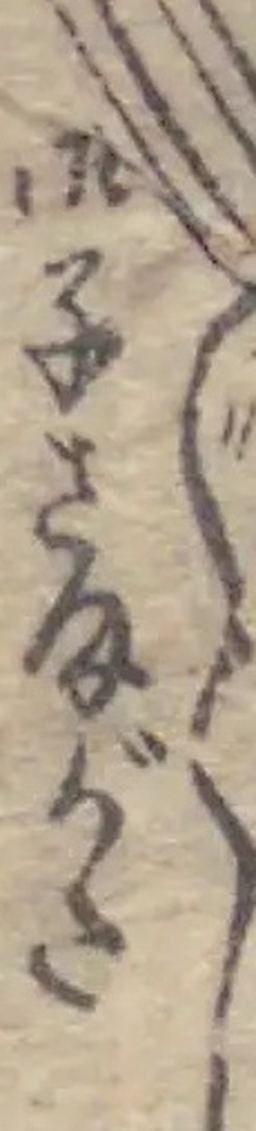御子さまがた
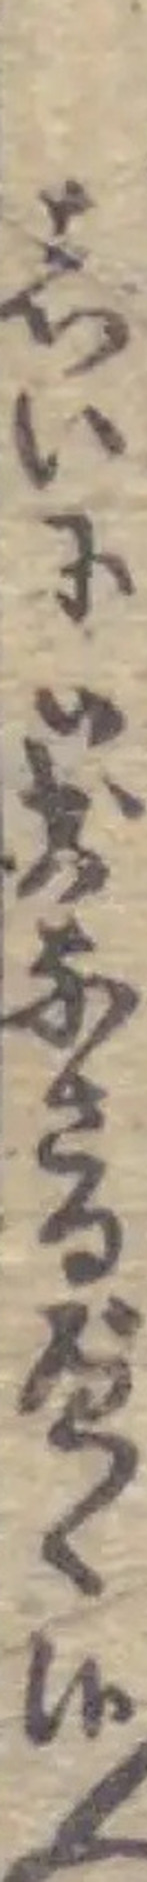しいに御出なさるべく候
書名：夭怪着到牒 2巻
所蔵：国立国会図書館 National Diet Library, JAPAN
